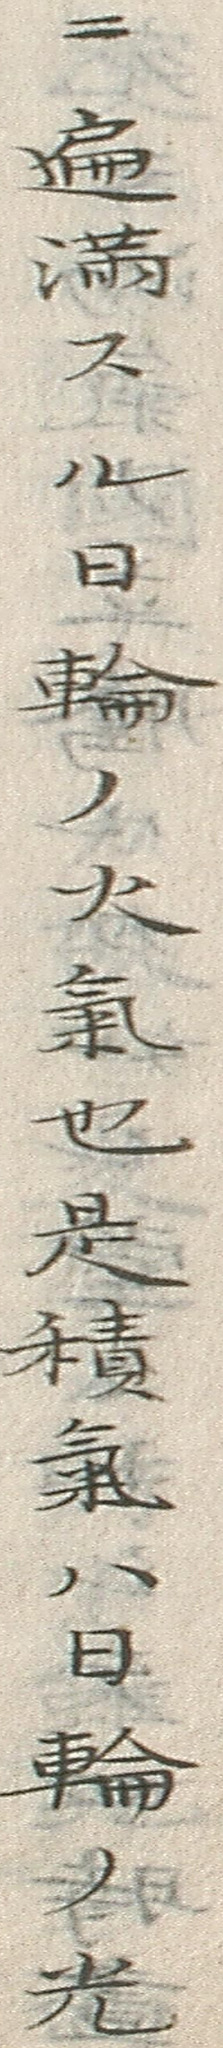ニ遍満スル日輪ノ火気也是積気ハ日輪ノ光
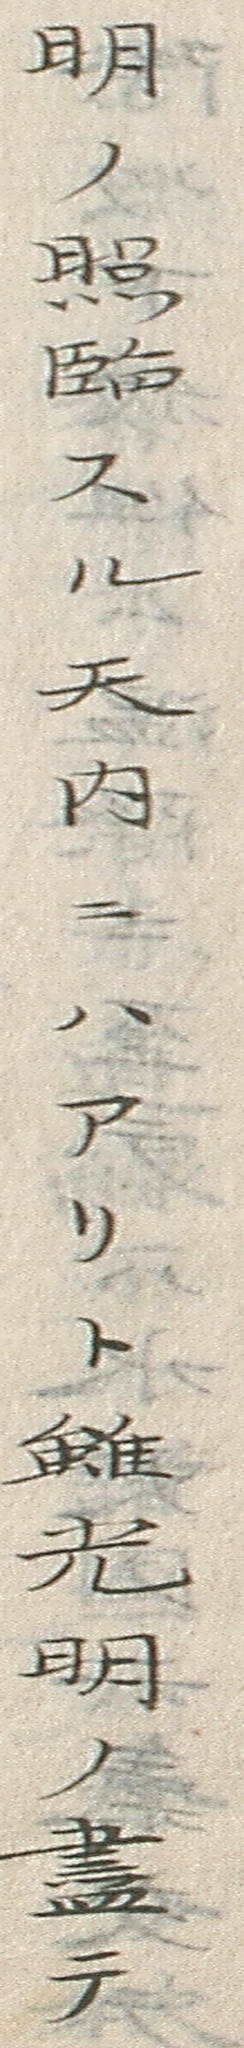明ノ照臨スル天内ニハアリト雖光明ノ尽テ
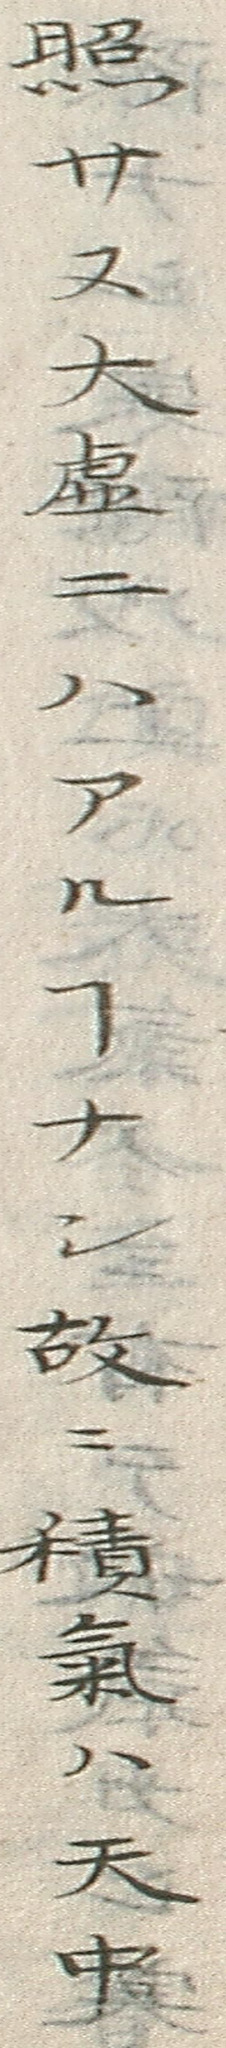照サヌ大虚ニハアルコトナシ故ニ積気ハ天中
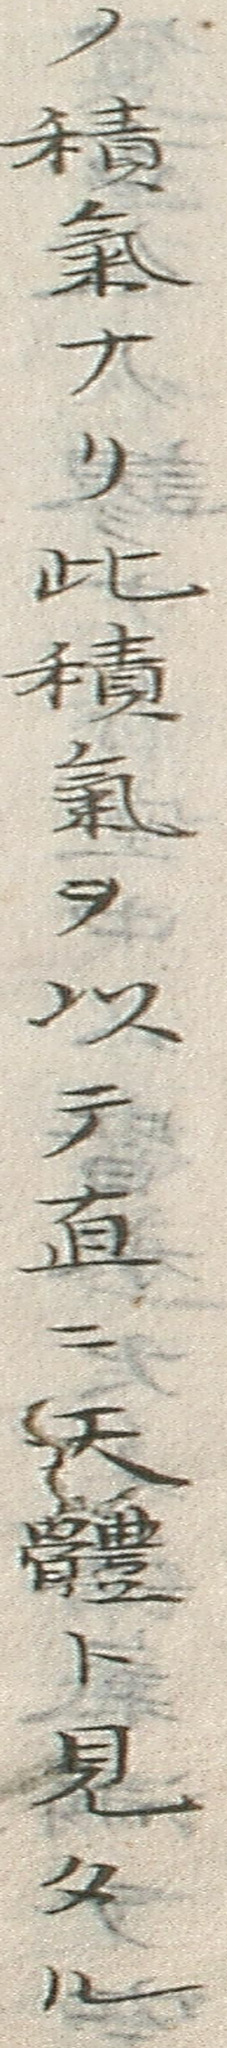ノ積気ナリ此積気ヲ以テ直ニ天体ト見タル

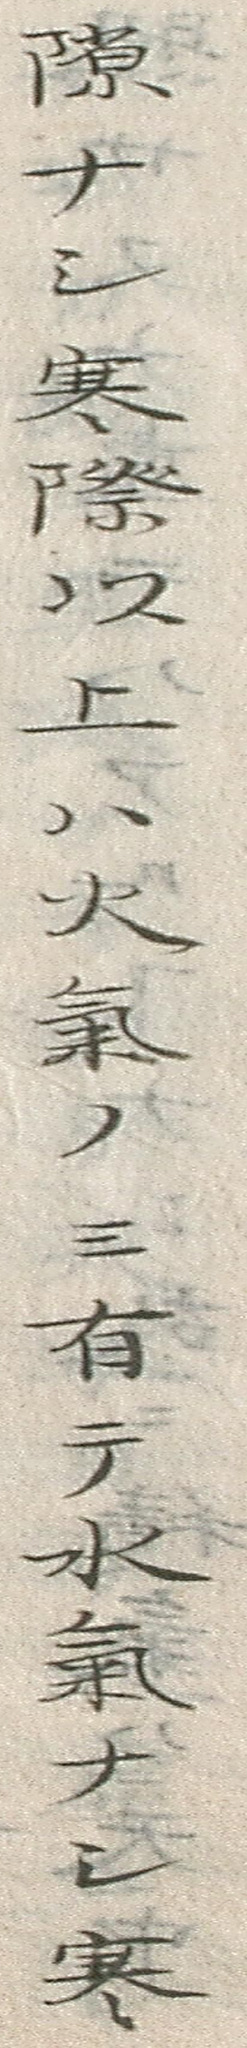隙ナシ寒際以上ハ火気ノミ有テ水気ナシ寒
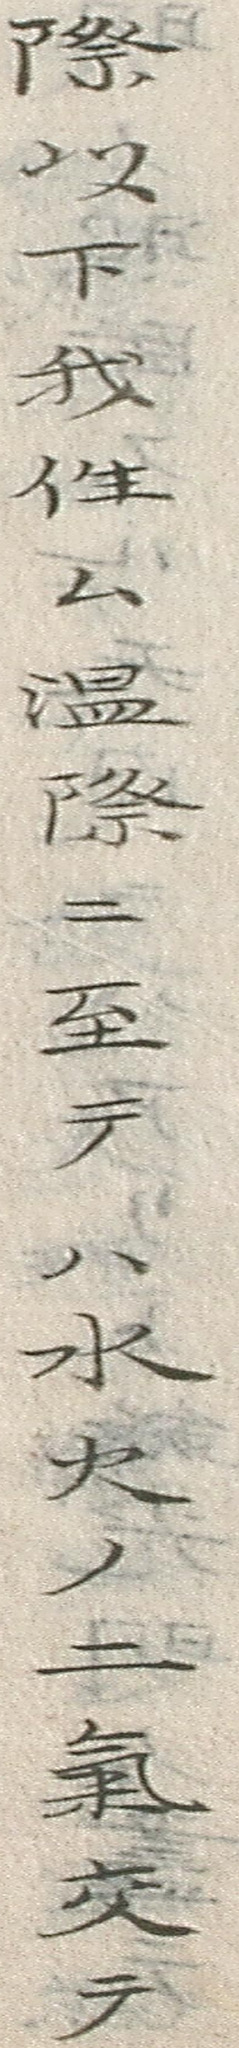際以下我住ム温際ニ至テハ水火ノ二気交テ
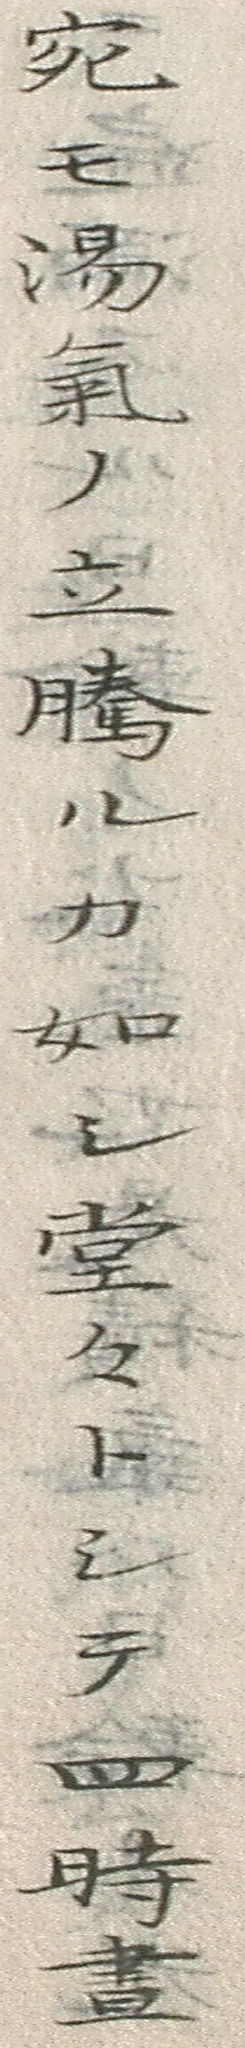宛モ湯気ノ立騰ルカ如シ堂々トシテ四時昼
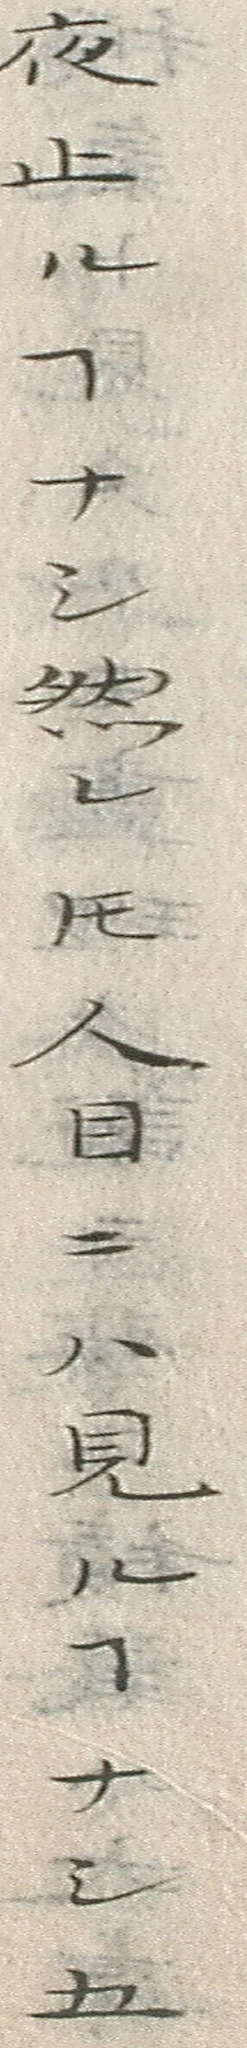夜止ルコトナシ然レトモ人目ニハ見ルコトナシ五
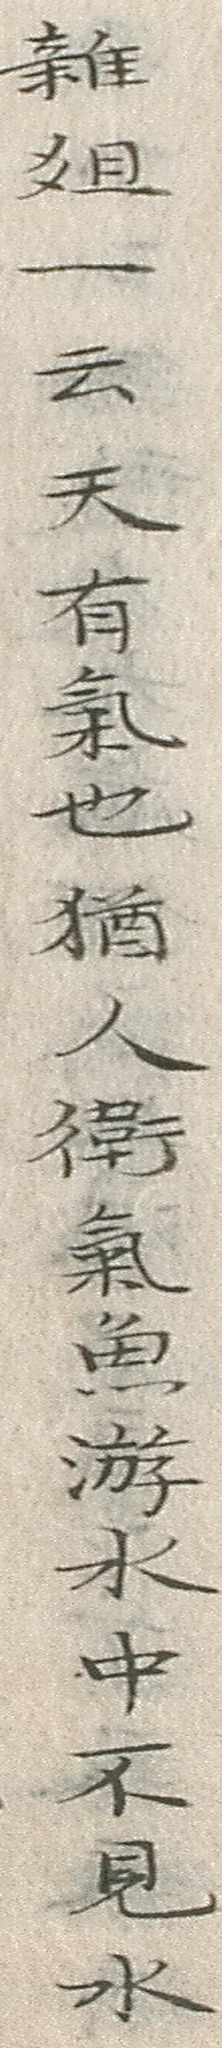雑俎一云天有気也猶人衛気魚游水中不見水
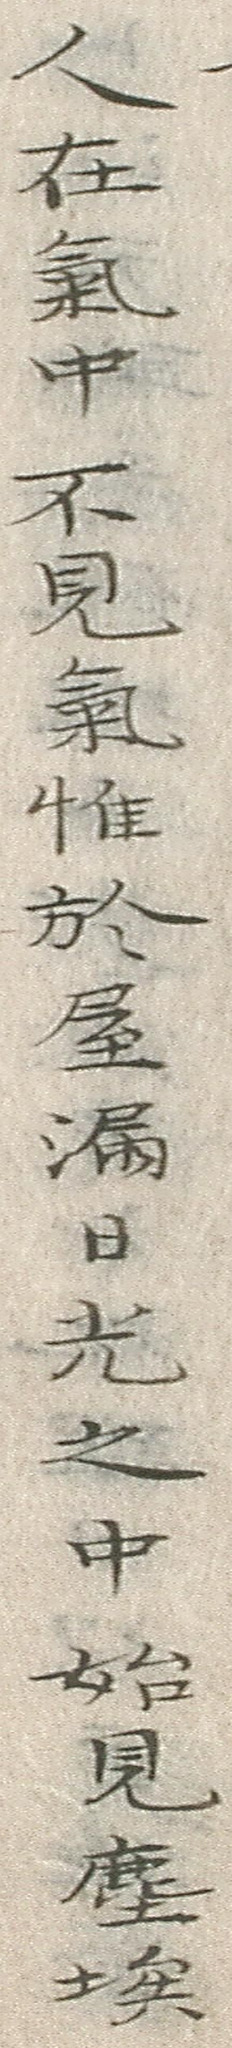人在気中不見気惟於屋漏日光之中始見塵埃
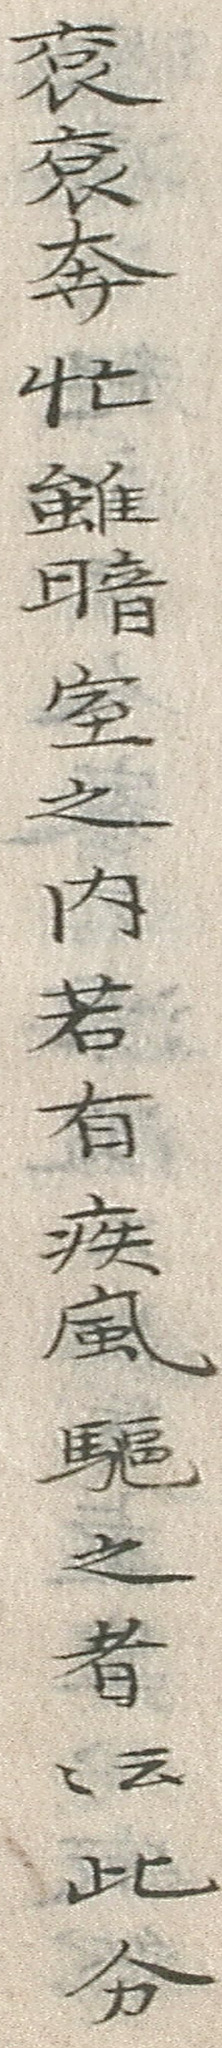袞袞奔忙雖暗室之内若有疾風駆之者云〻此分
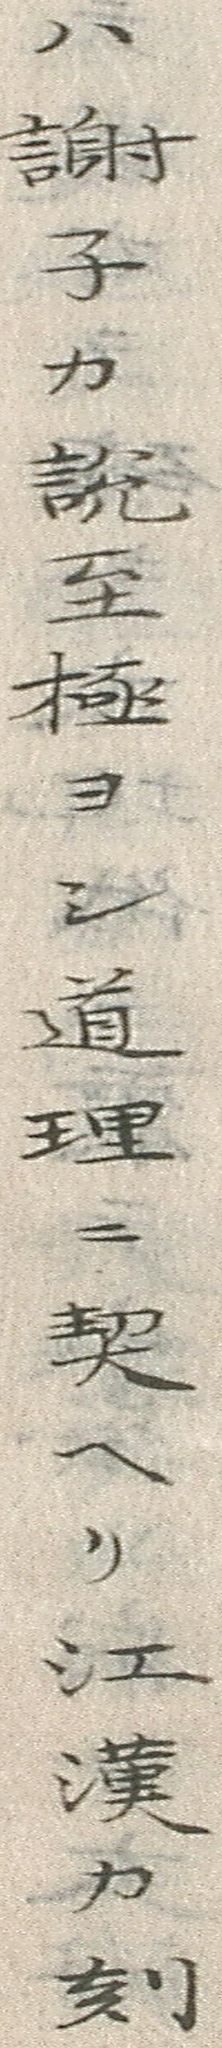ハ謝子カ説至極ヨシ道理ニ契ヘリ江漢カ刻
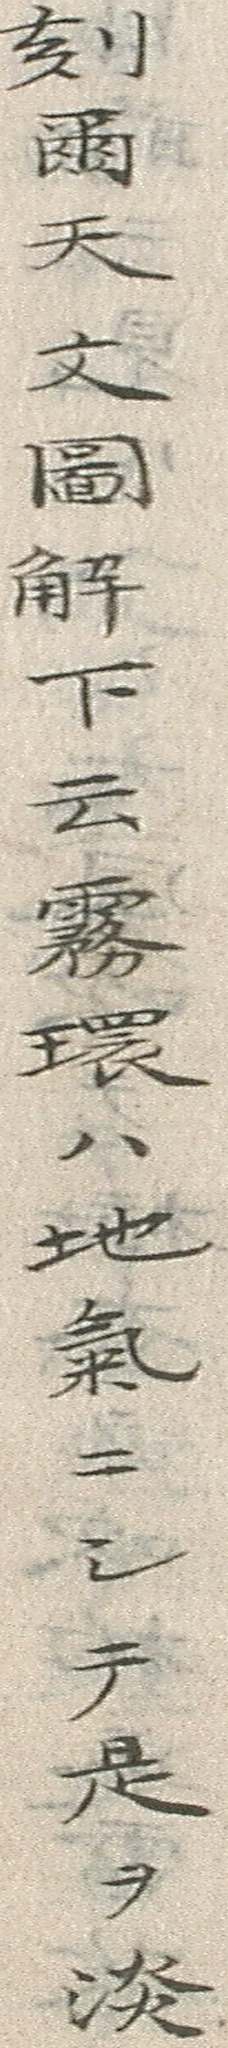刻爾天文図解下云霧環ハ地気ニシテ是ヲ淡
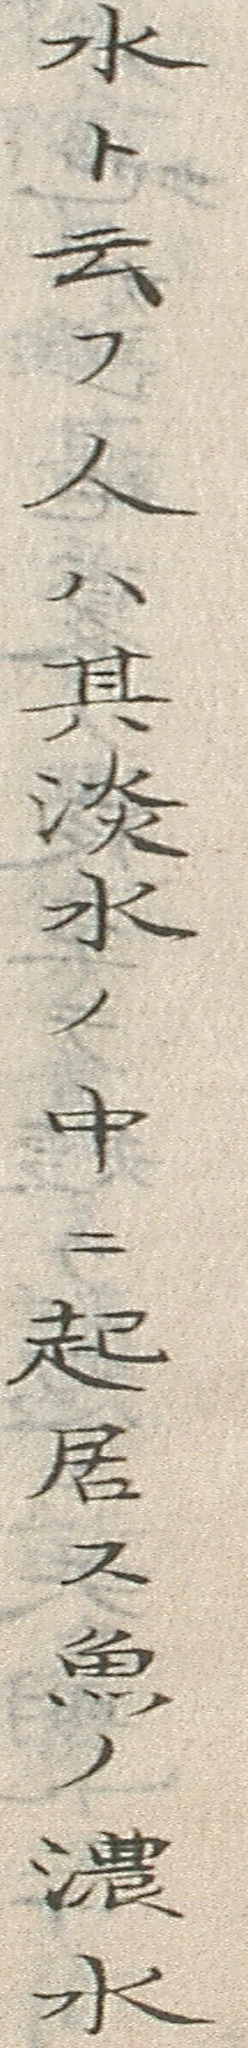水ト云フ人ハ其淡水ノ中ニ起居ス魚ノ濃水
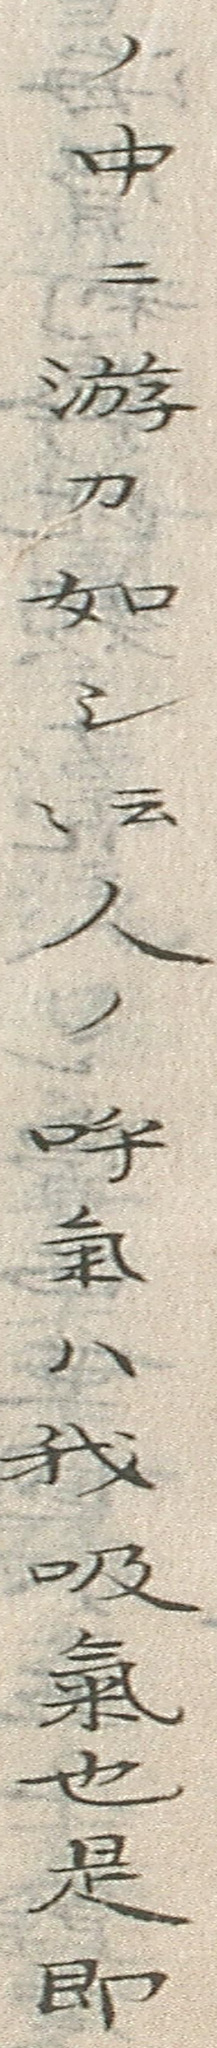ノ中ニ游カ如シ云〻人ノ呼気ハ我吸気也是即
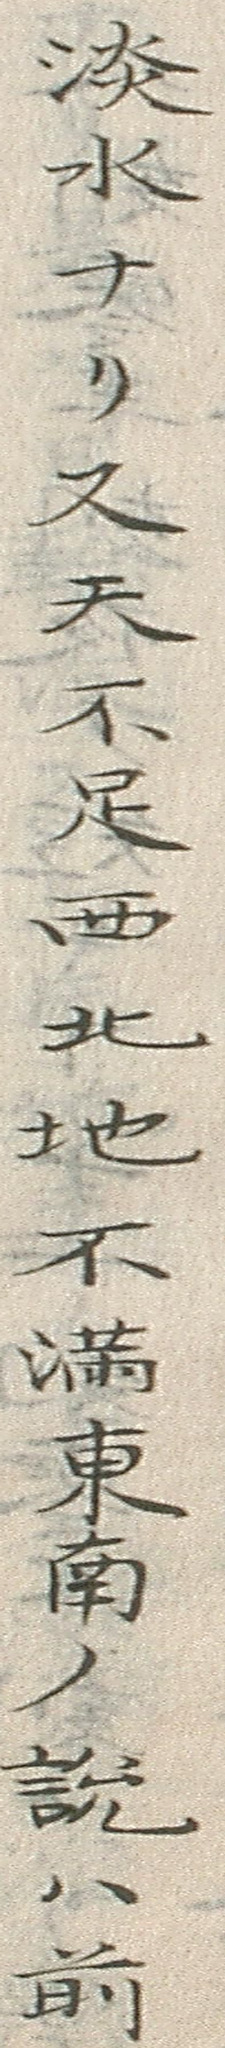淡水ナリ又天不足西北地不満東南ノ説ハ前
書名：天學略名目羽翼　全
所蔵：東京大学地震研究所図書室 Earthquake Research Institute Library, The University of Tokyo, JAPAN
